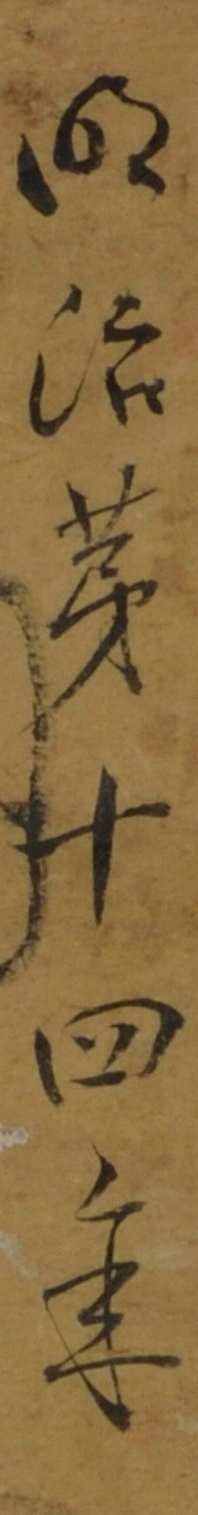明治第十四年
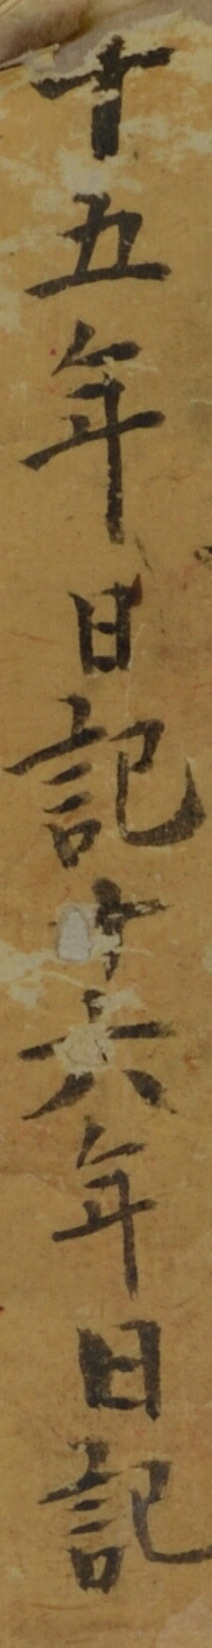十五年日記十六年日記
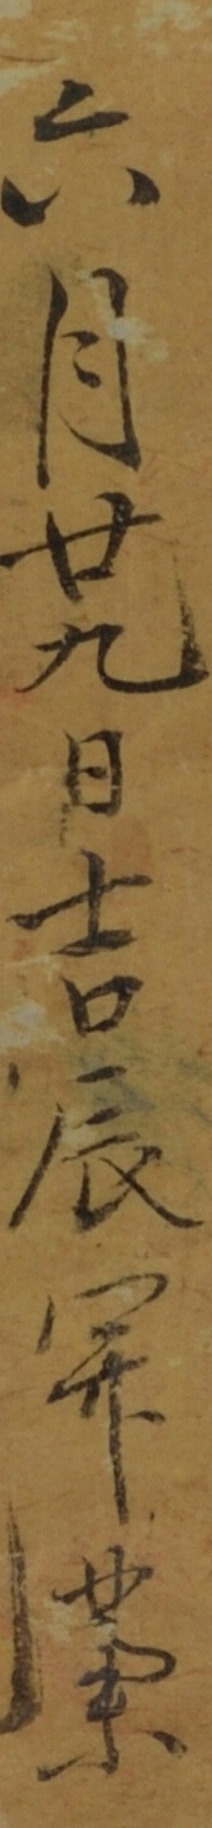六月廿九日吉辰開業

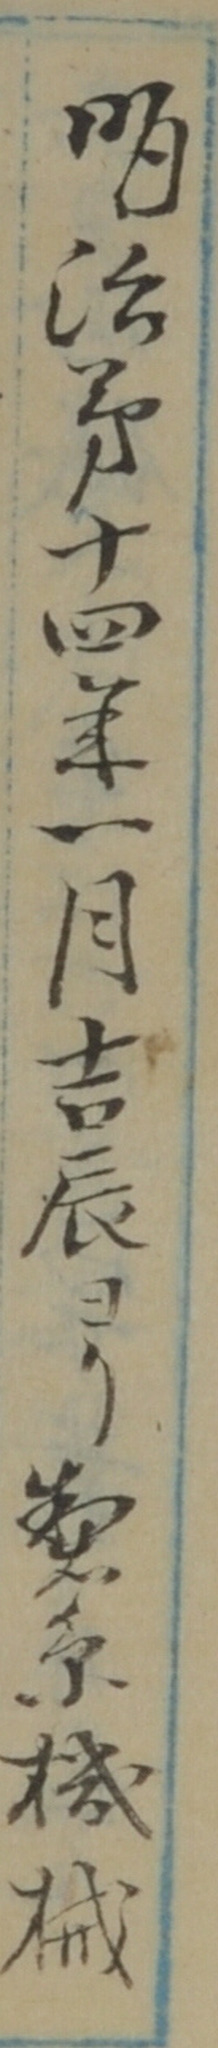明治第十四年一月吉辰ヨリ製糸機械
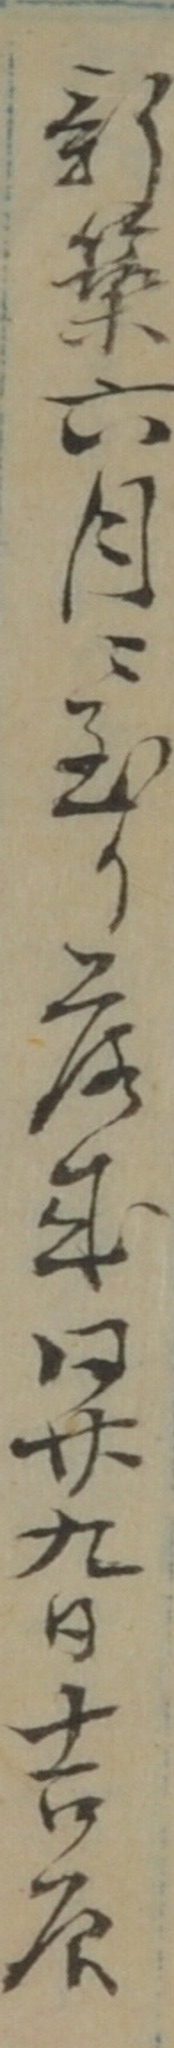新築六月ニ至リ落成同廿九日吉辰
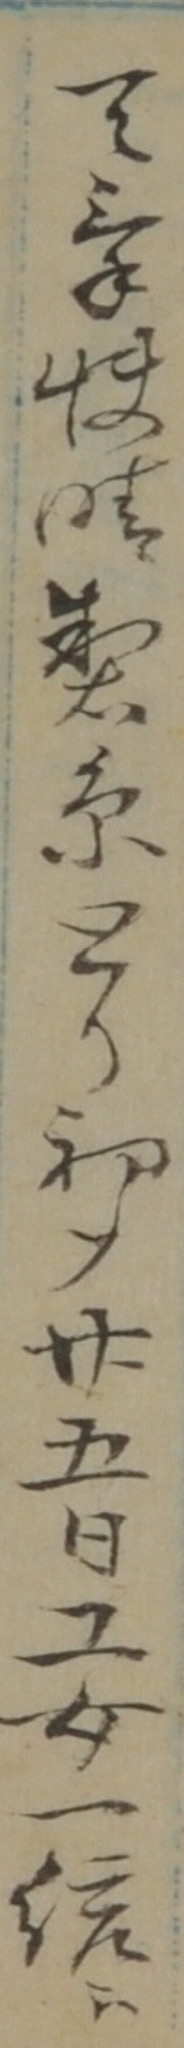天気快晴製糸とり初メ廿五日工女一統江
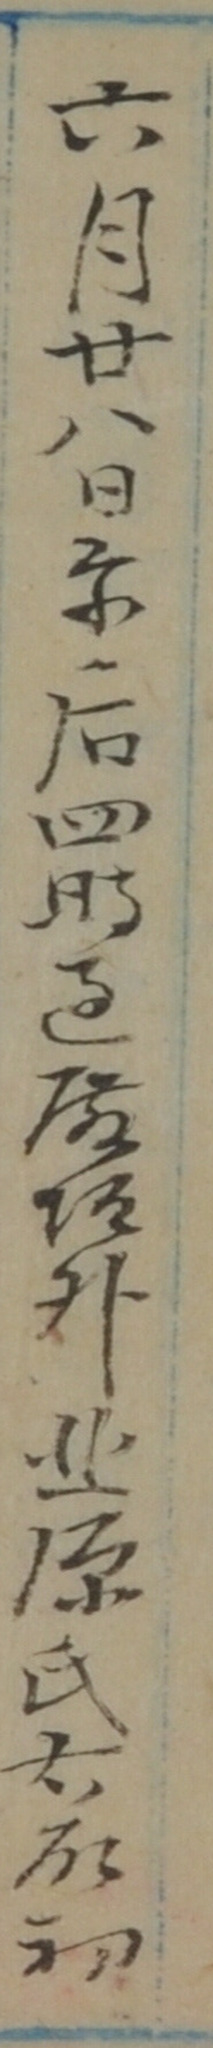六月廿八日午后四時過殿垣外北原氏右取初
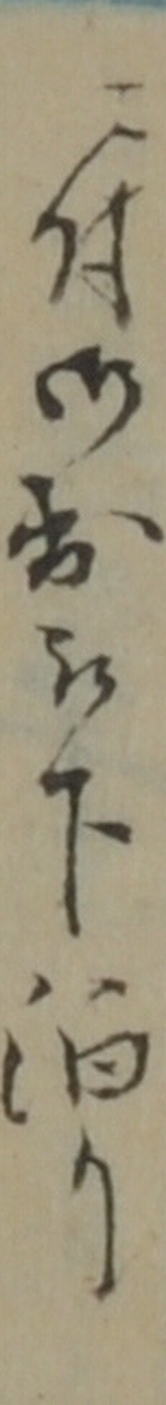ニ付御出被下泊リ
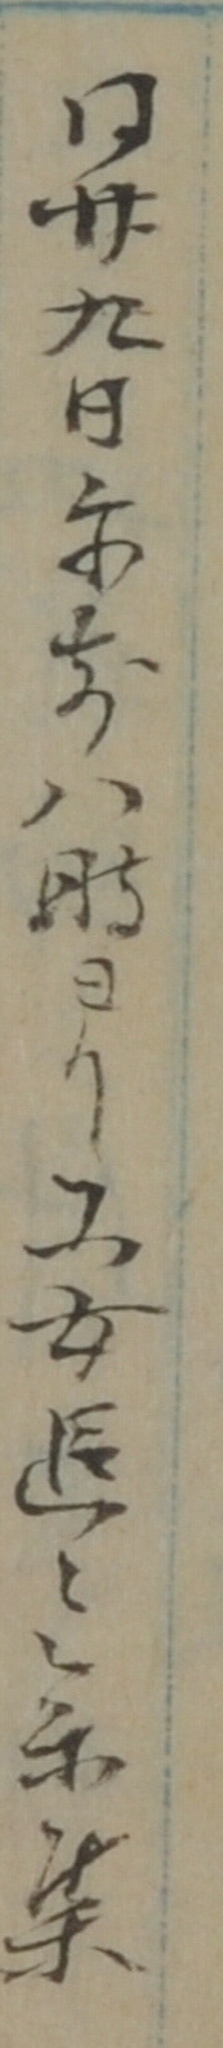同廿九日午前八時ヨリ工女追々参集
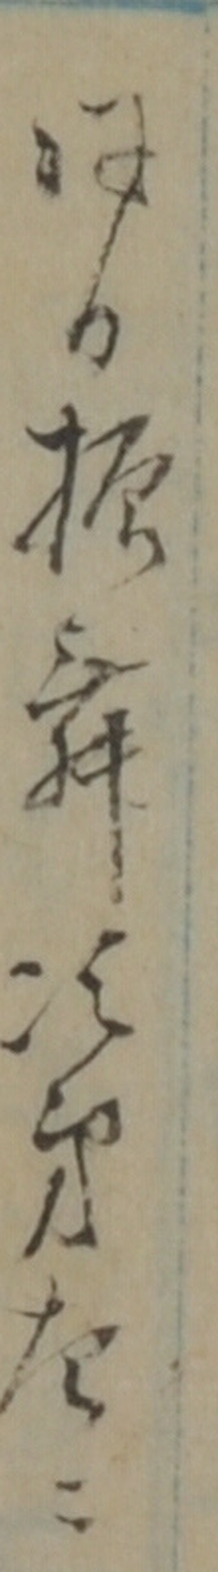同日振舞次第左ニ

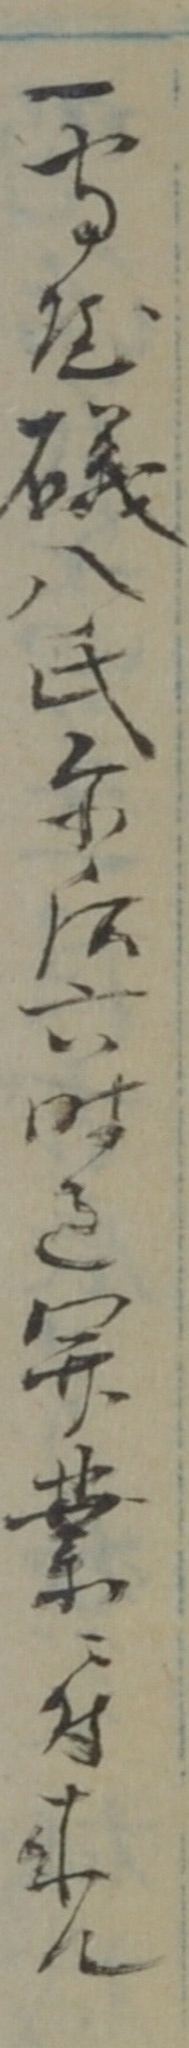一守屋磯八氏午后六時過開業ニ付来ル
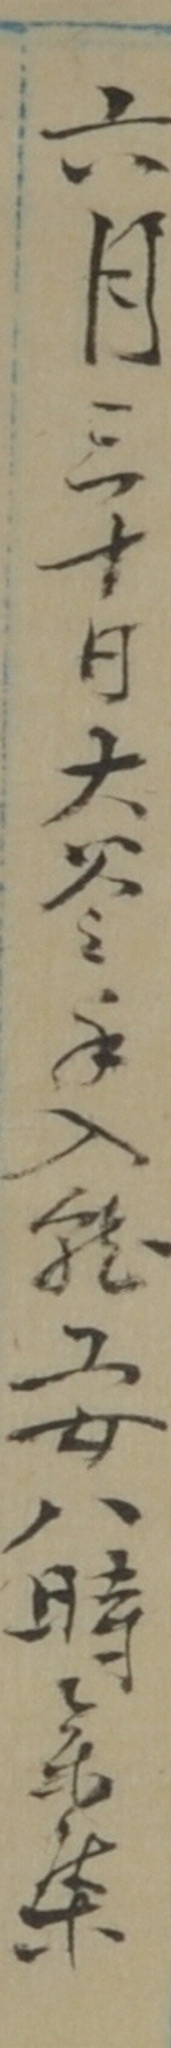六月三十日大釜手入就工女八時参集
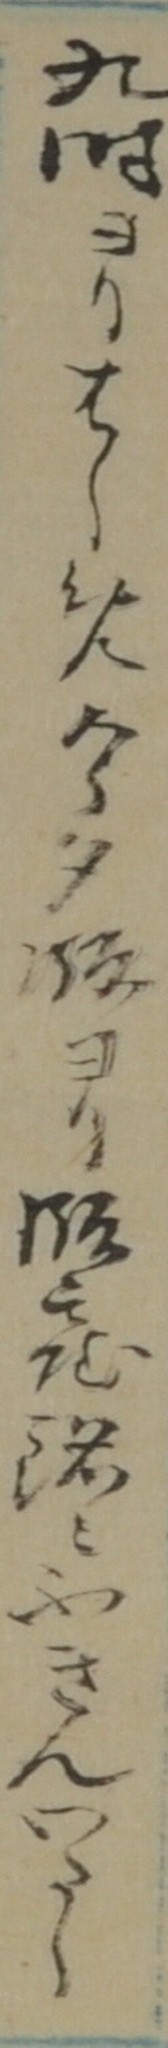九時ヨリはしめ今夕ヨリ飯台銘々ふきんいたし
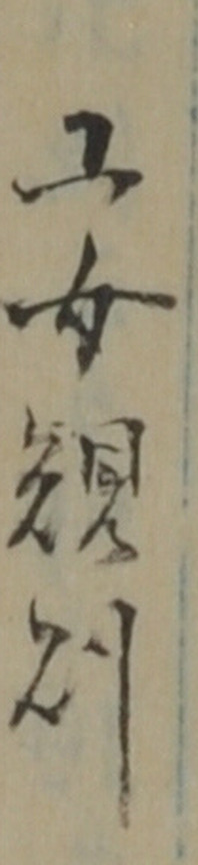工女規則
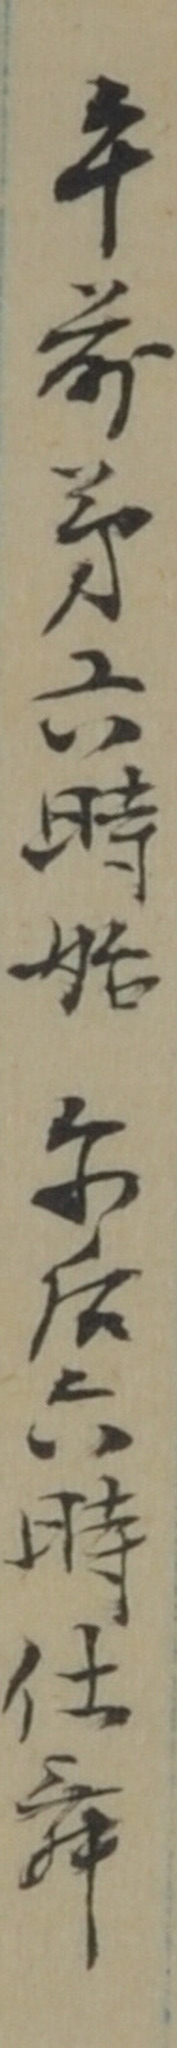午前第六時初午後六時仕舞
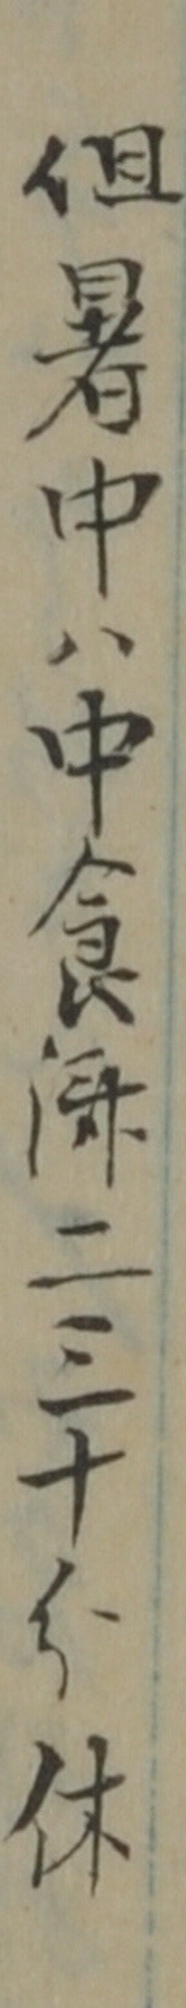但暑中ハ中食済二三十分休
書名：機械製糸所日記
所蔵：伊那市立高遠町図書館・合同会社AMANE
